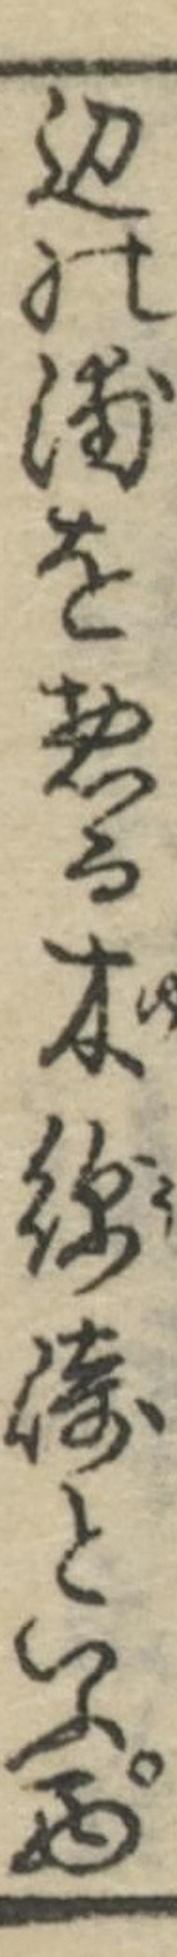辺の浦を惣而木綿崎といふ。西
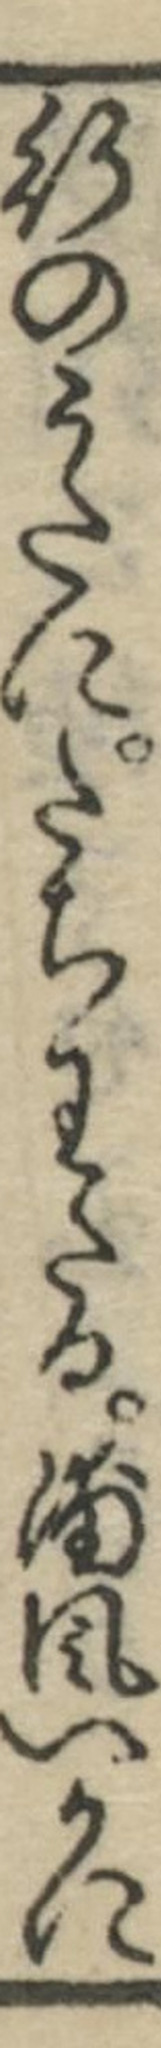行のうたに。たちわたる。浦風いかに
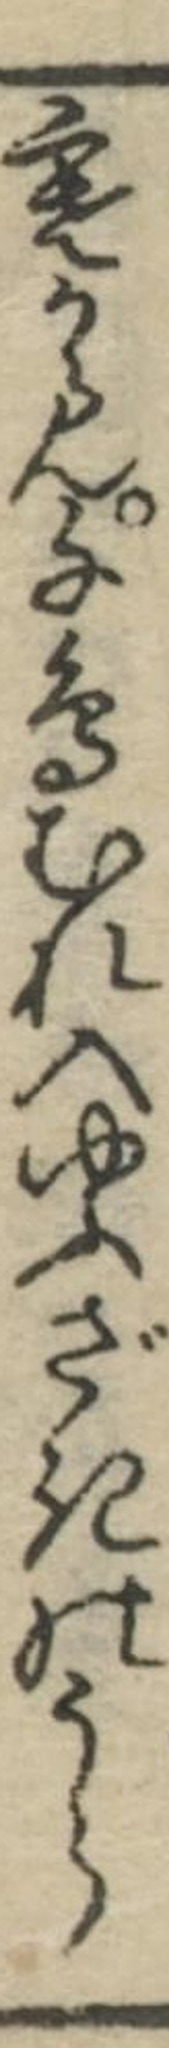寒からん。千鳥むれ入ゆふざきのうら

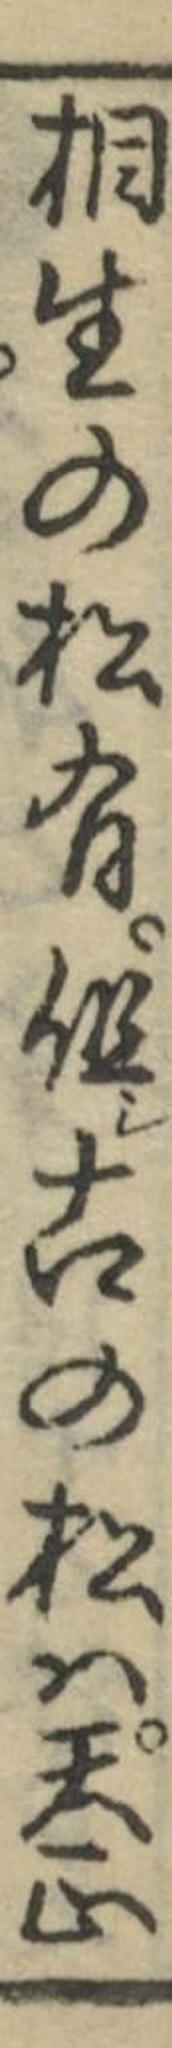相生の松有。但しこの松は。天正
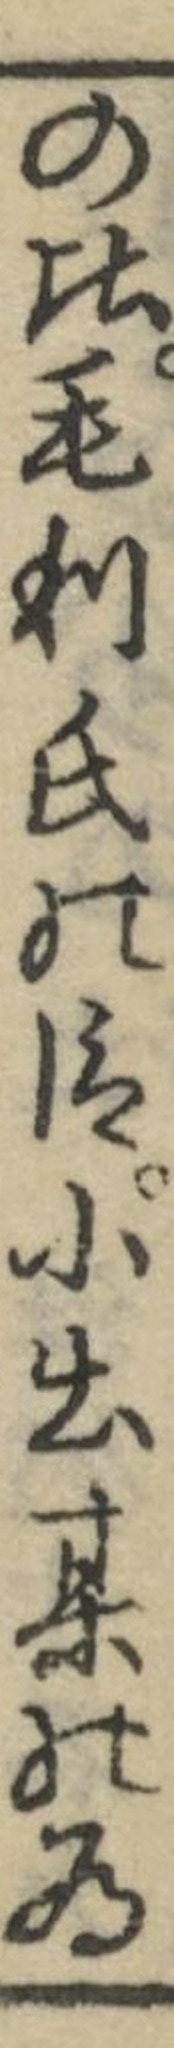の比。毛利氏の臣。小出某の為
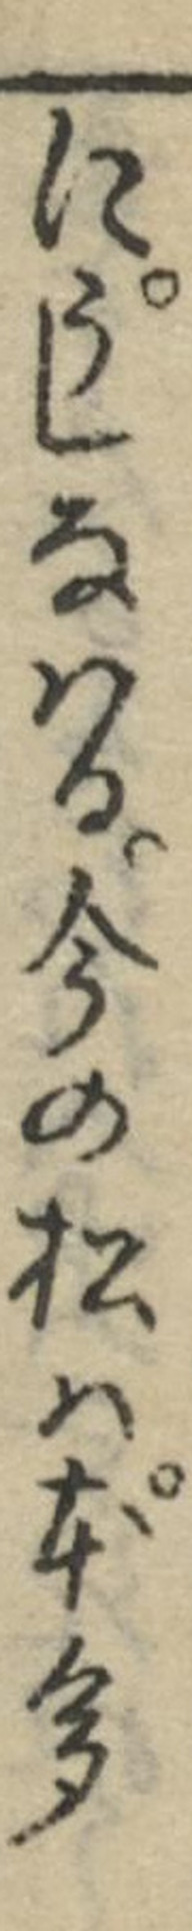に。うしなはる。今の松は。本多
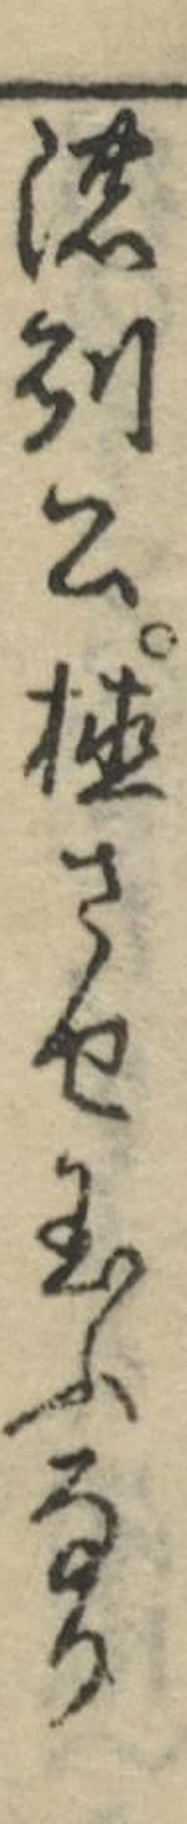濃州公。植させ玉ふなり
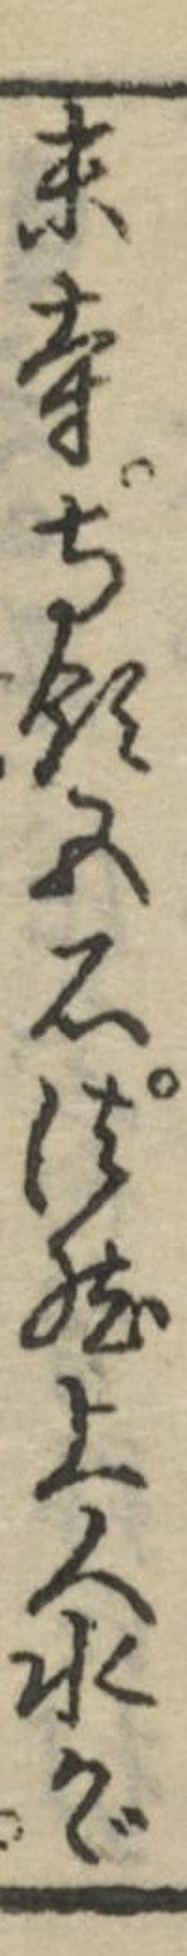末寺。寺領五石。法然上人水かゞ
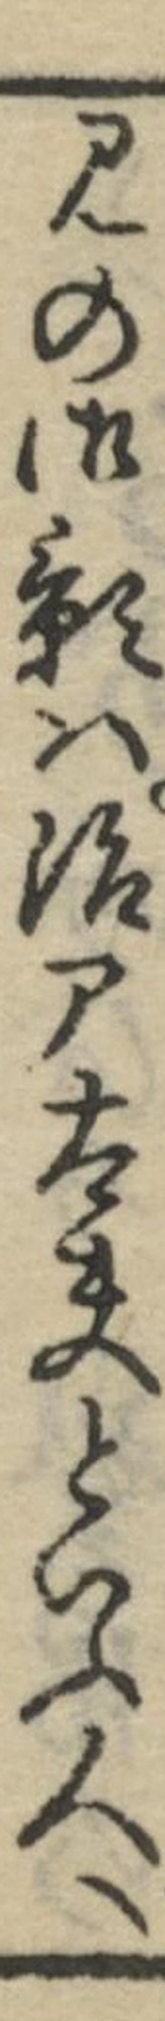見の御影は。治部太夫といふ人へ。
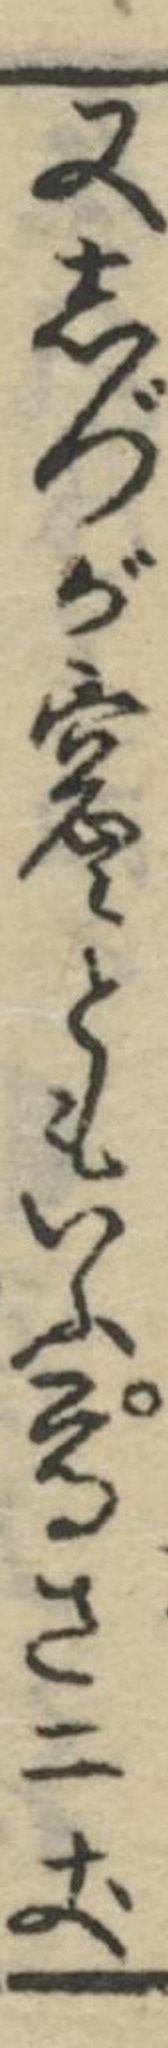又しづが窓ともいふ。高さニ丈
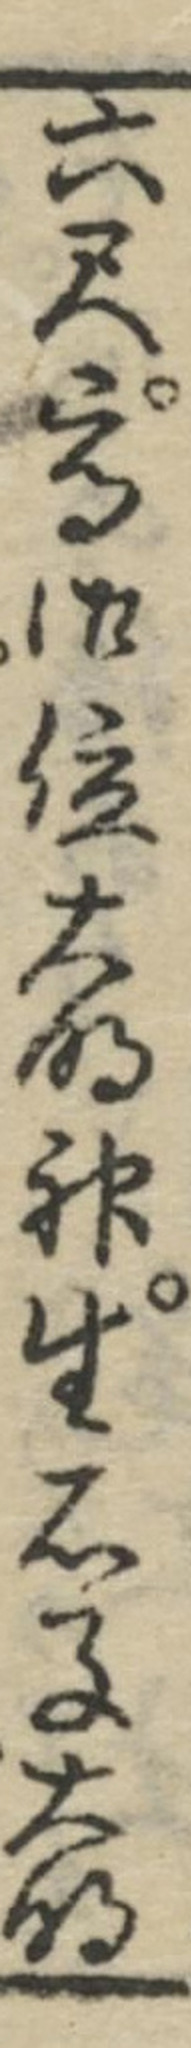六尺。高御位大明神。生石子大明
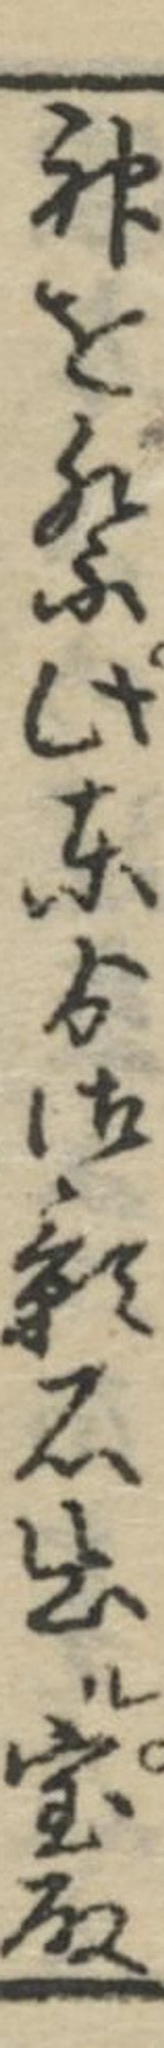神を祭。此東ゟ御影石出る。宝殿
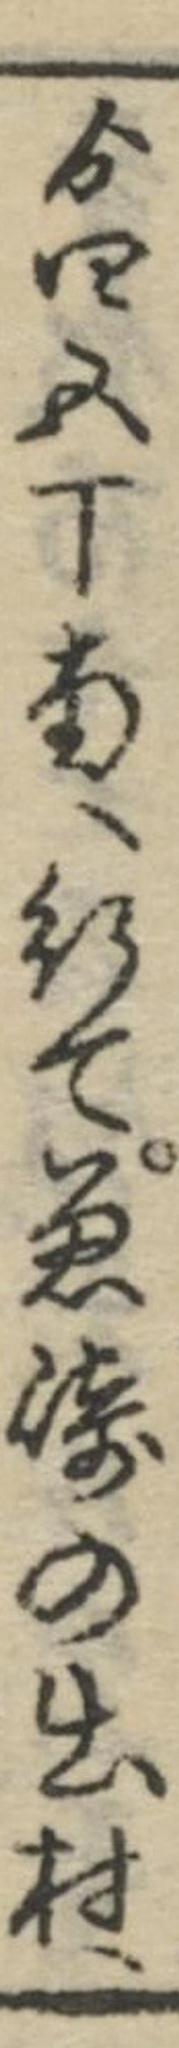ゟ四五丁南へ行て。魚崎の出村へ
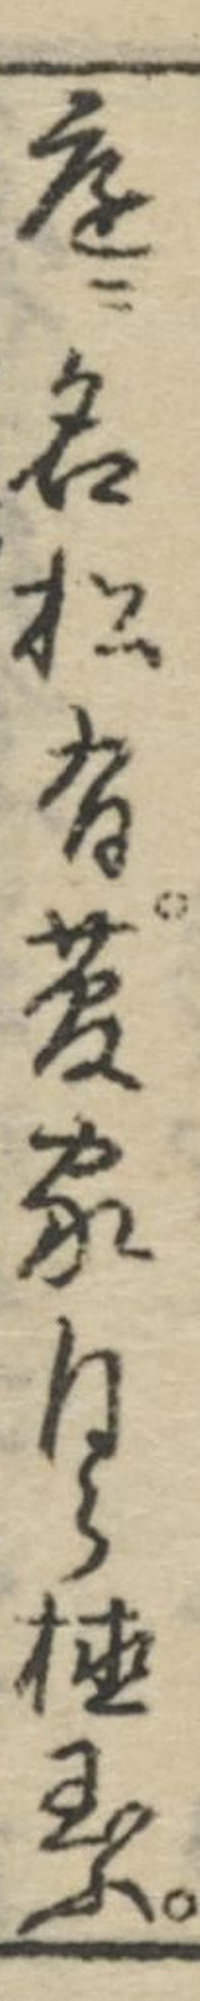庭に名松有。菅家自ら植え玉ふ。
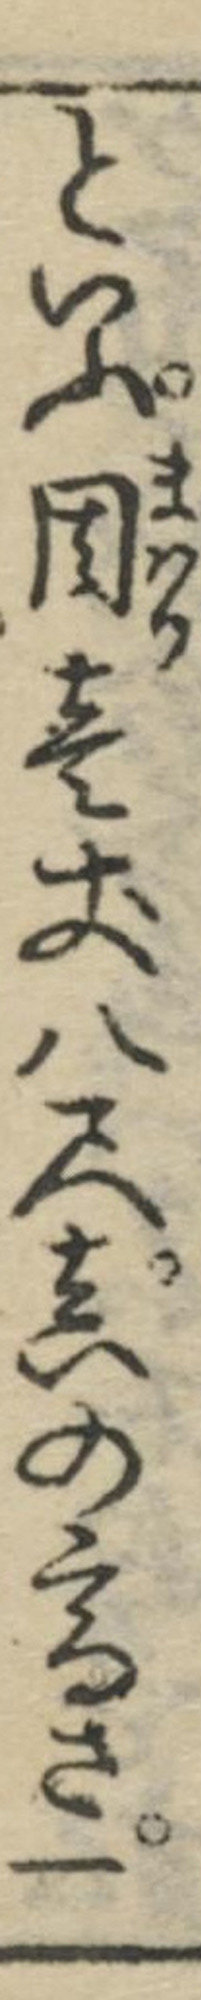といふ。周壱丈八尺。真の高さ。一
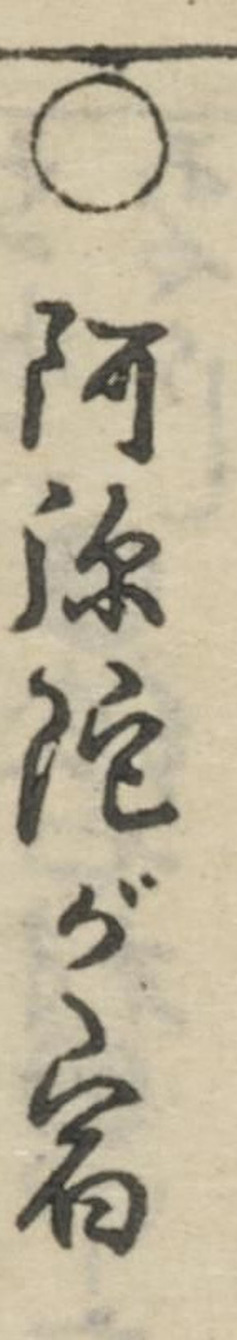○阿弥陀が宿
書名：但州城崎浴湯辧
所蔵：東京大学地震研究所図書室 Earthquake Research Institute Library, The University of Tokyo, JAPAN
